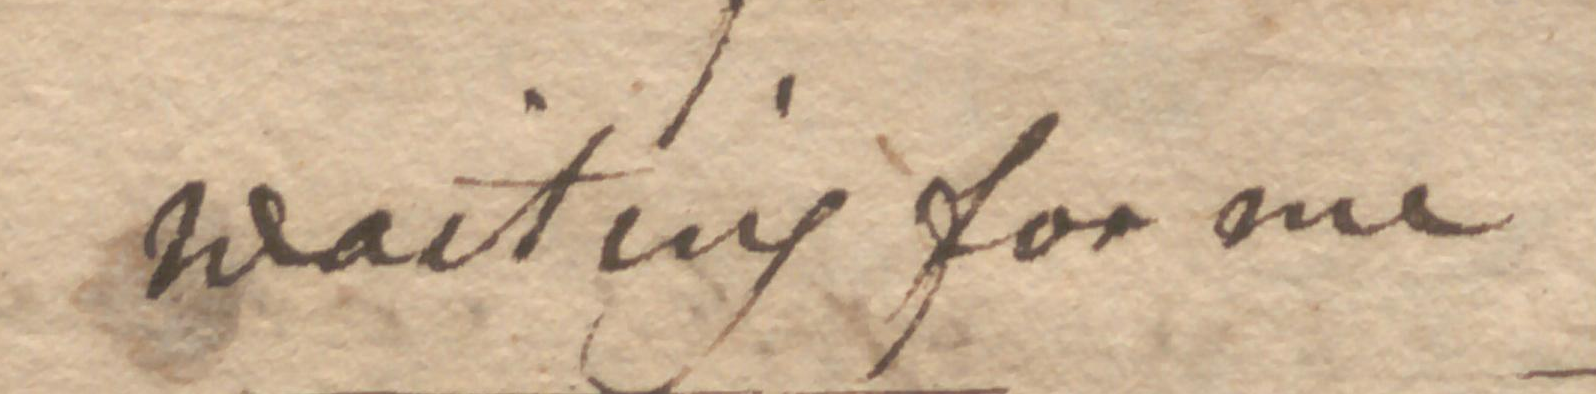waiting for me
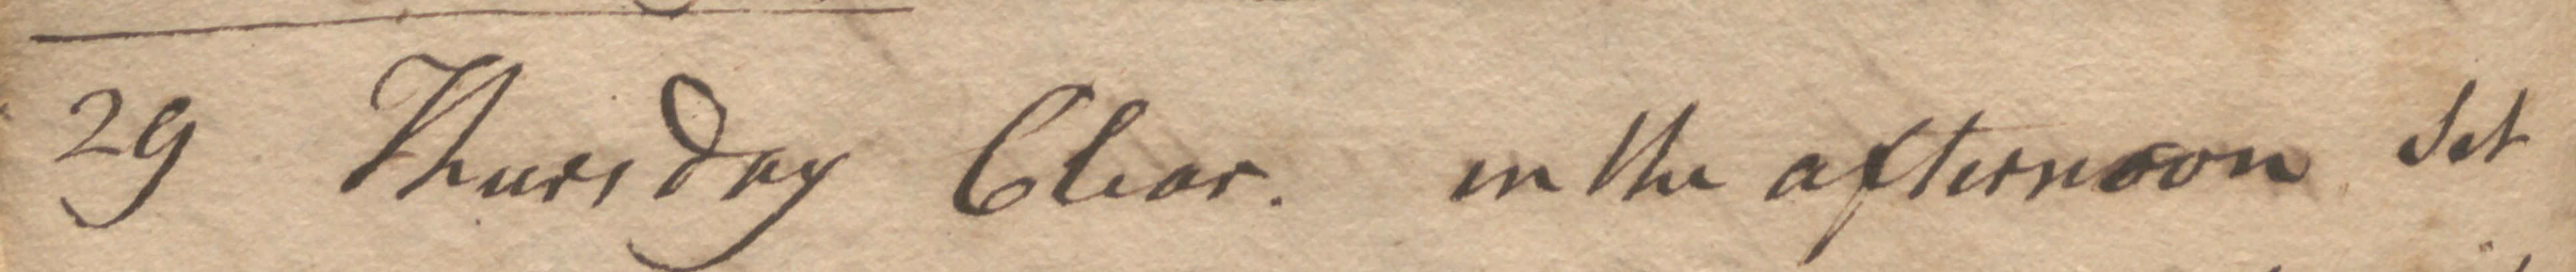29 Thursday Clear. in the afternoon set
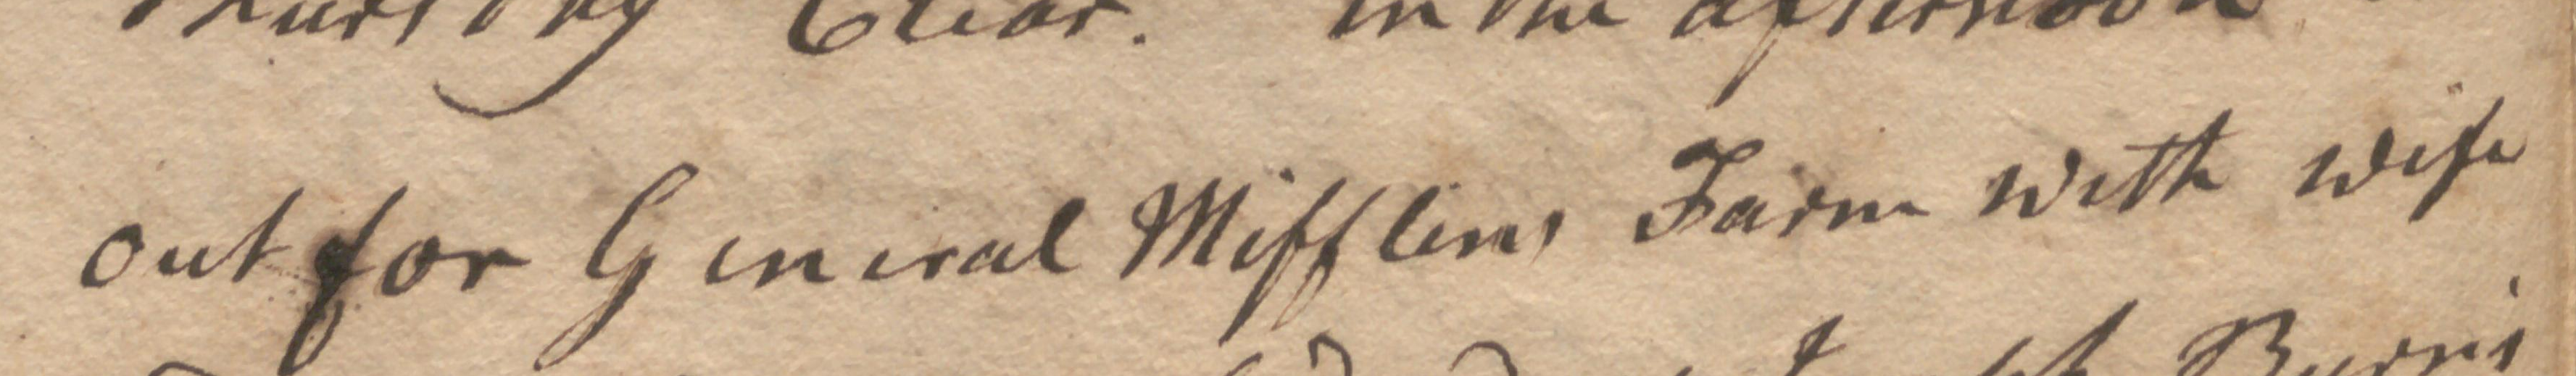out for General Mifflins Farm with wife
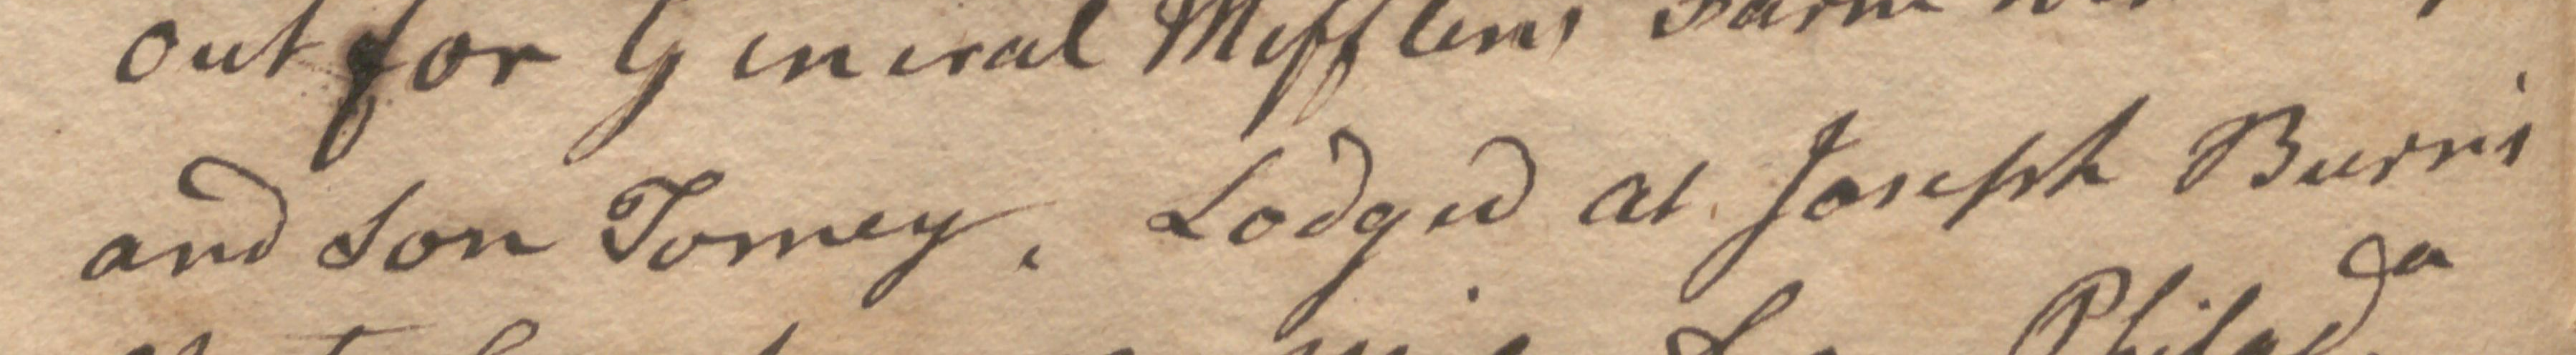and Son Tomey, Lodged at Joseph Burns
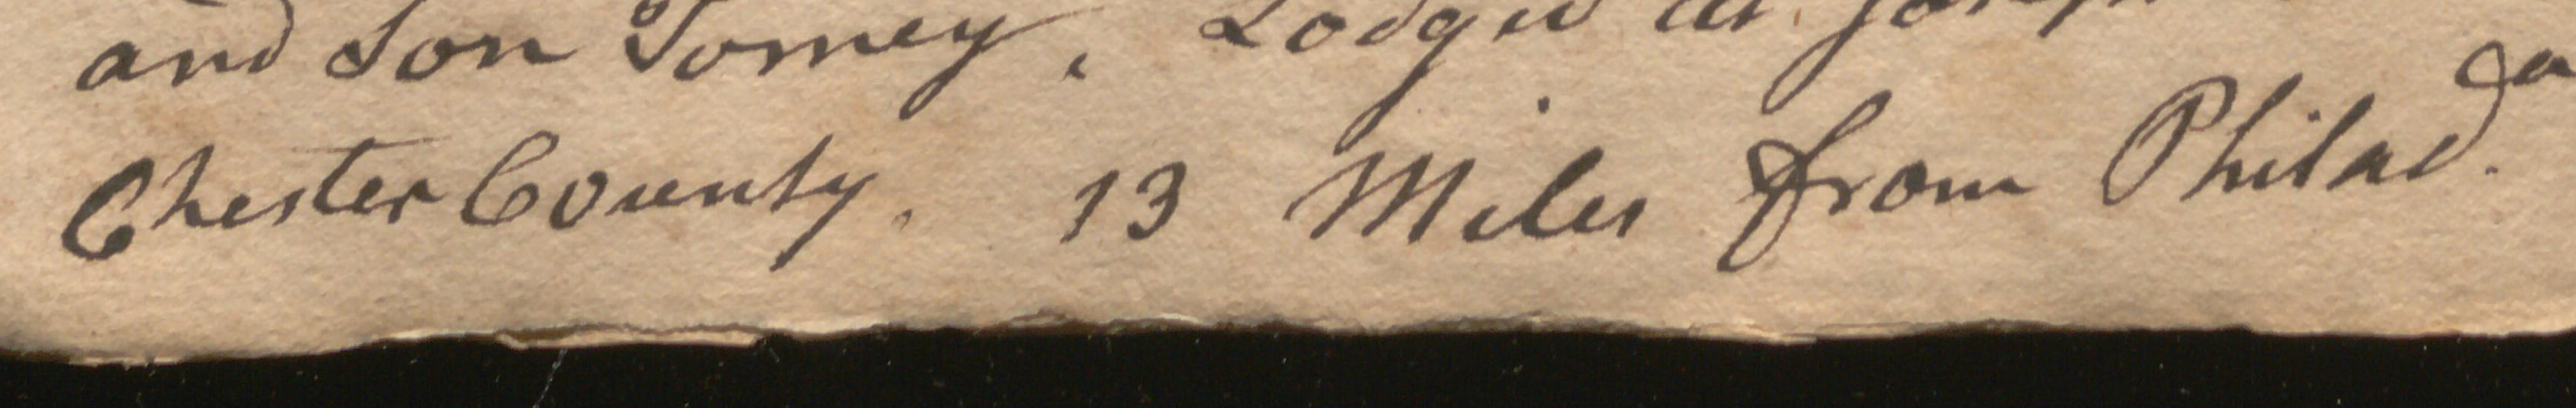Chester County. 13 Miles from Philad^a.
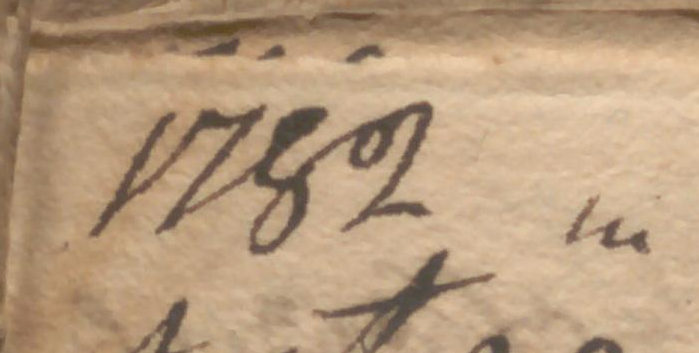1782
